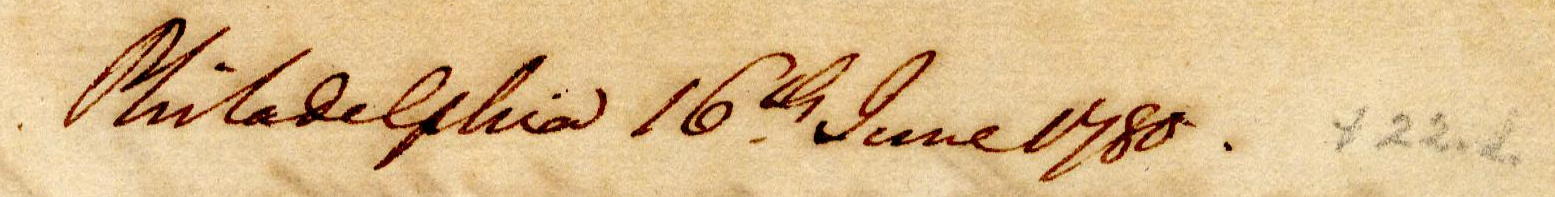Philadelphia 16^th. June 1780. 22.d
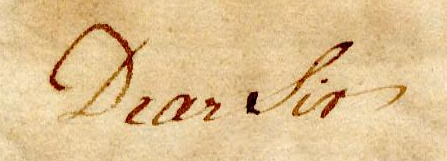Dear Sir
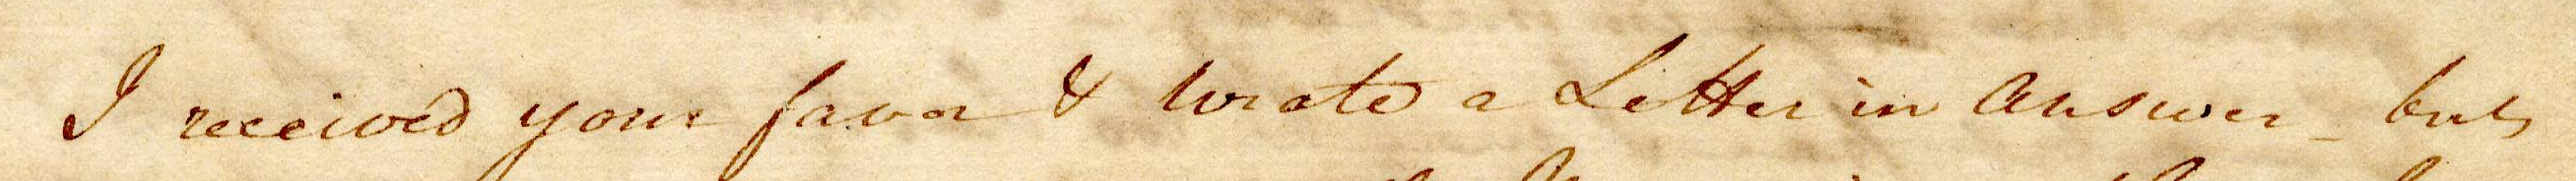I received your favor & wrote a Letter in Answer but
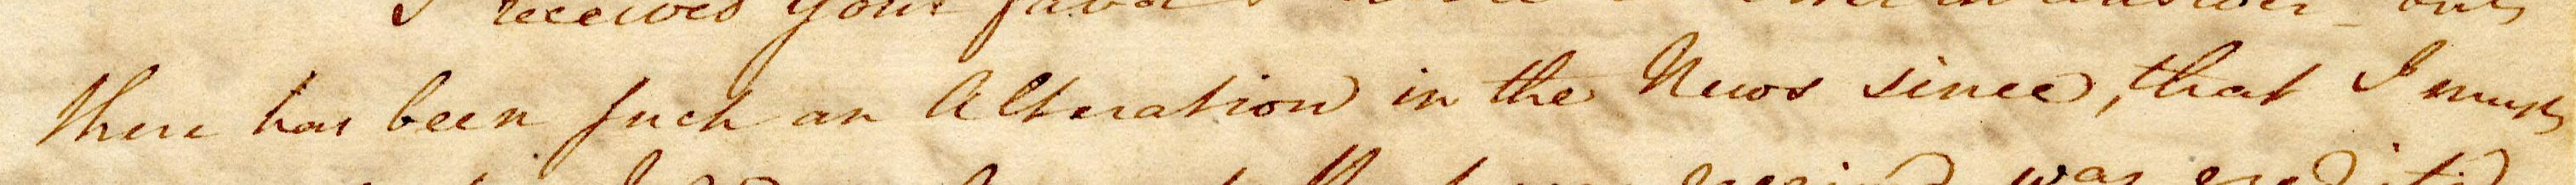there has been such an Alteration in the News since that I must
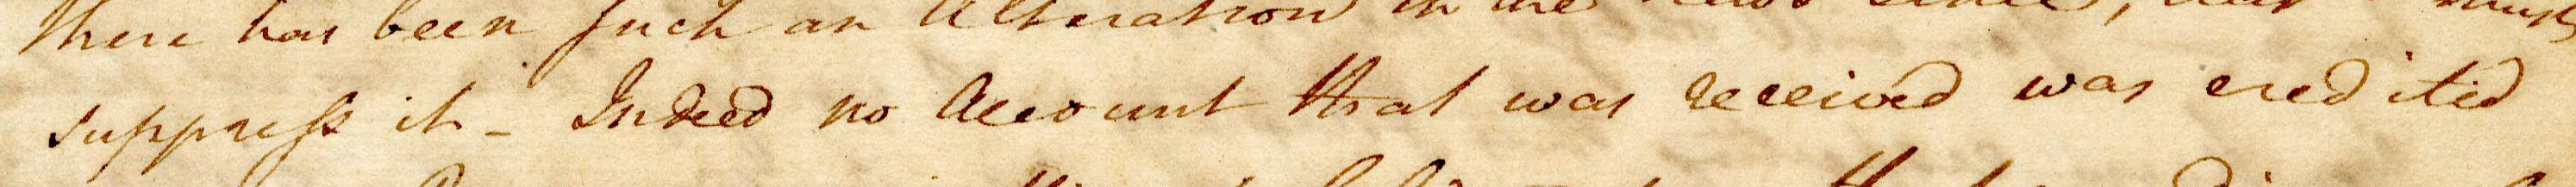suppress it. Indeed no account that was received was credited
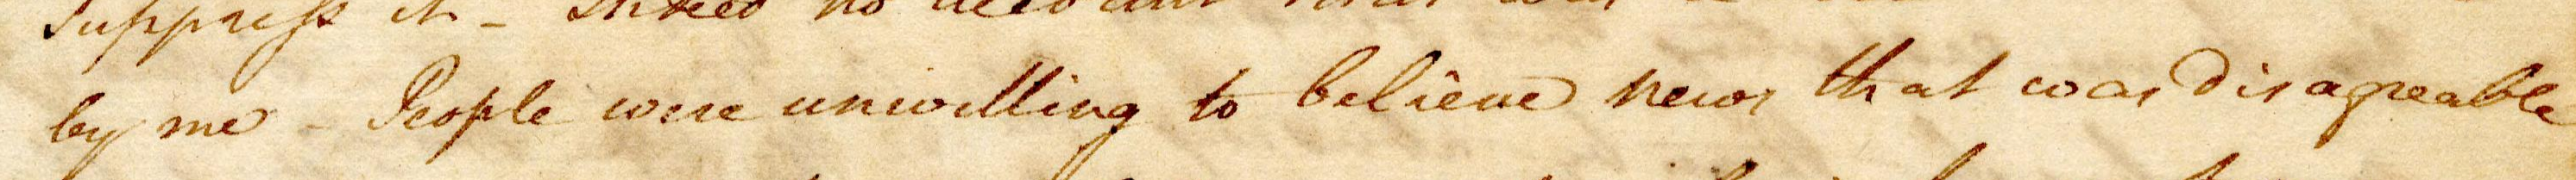by me. People were unwilling to believe news that was disagreable
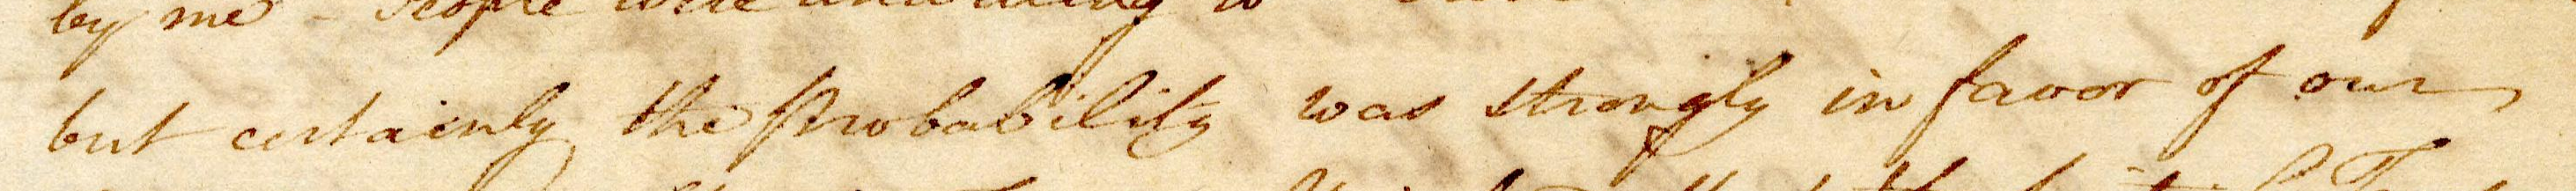but certainly, the probability was strongly in favor of our
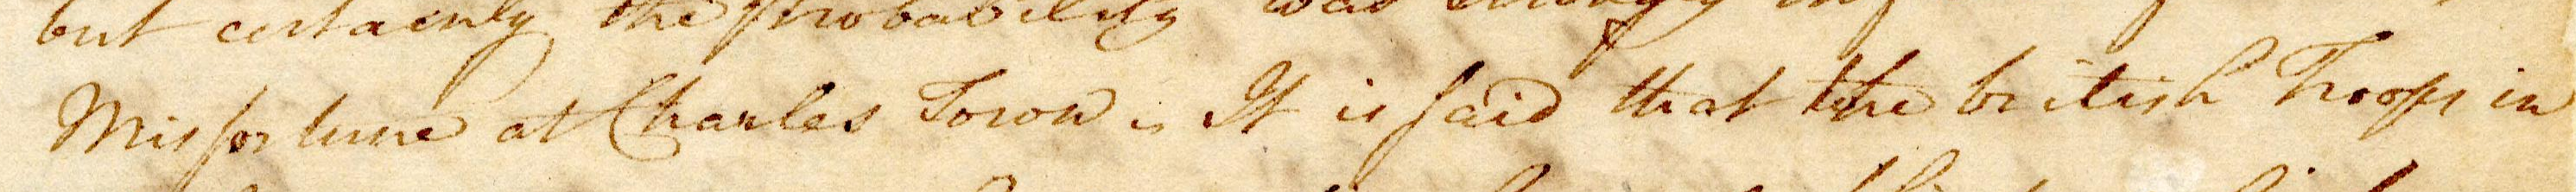Misfortune at Charles Torwn. It is said that the british Troops in
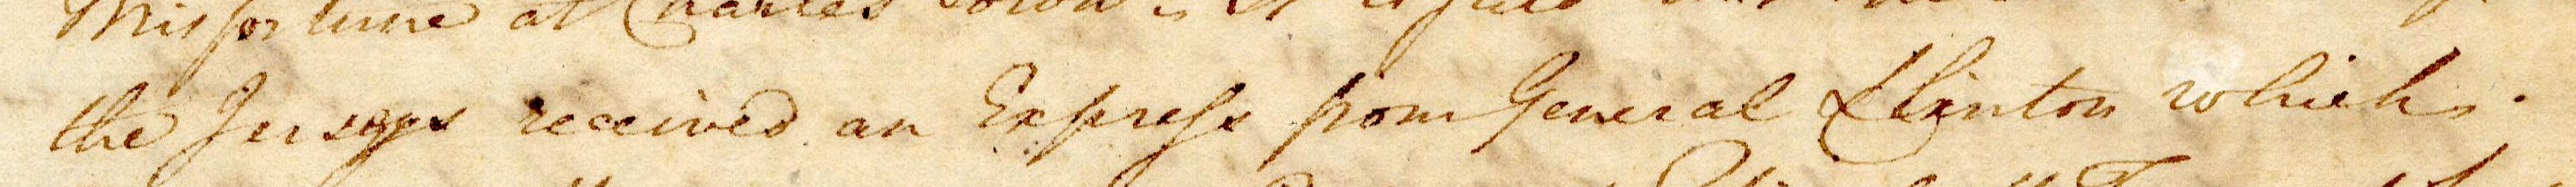the Jerseys received an Express from General Clinton which
